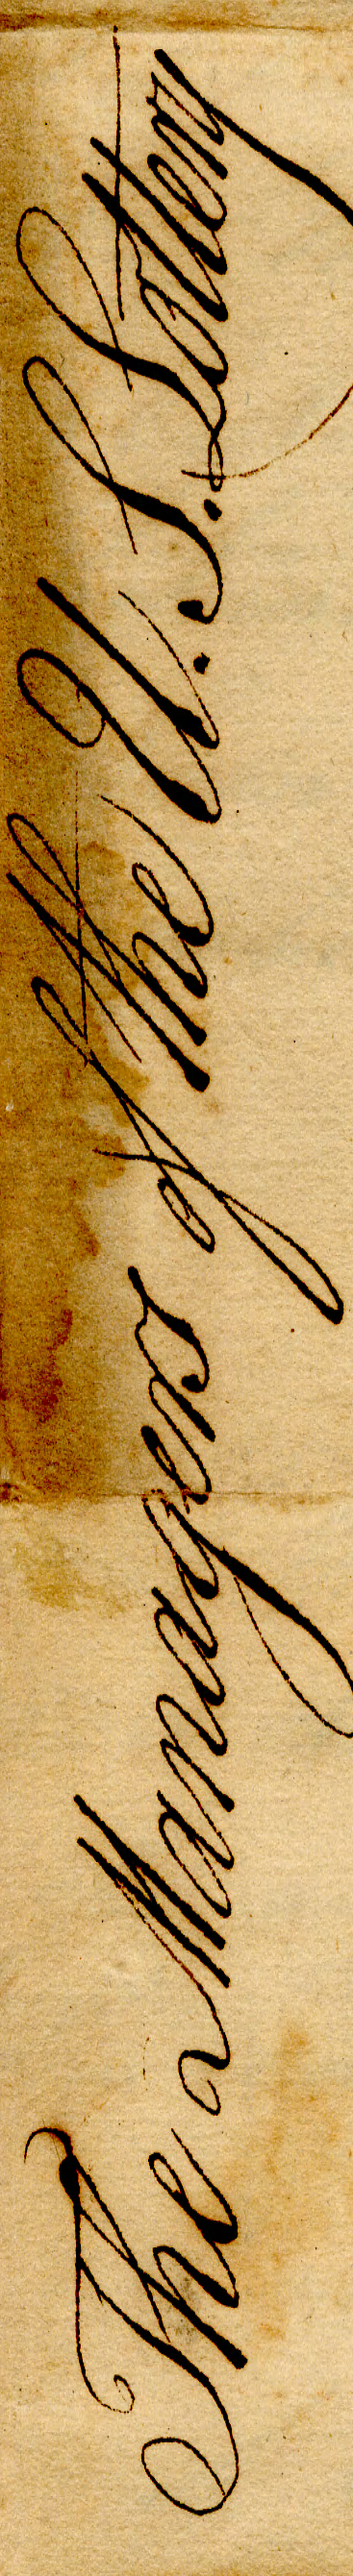The Managers of the U.S. Lottery
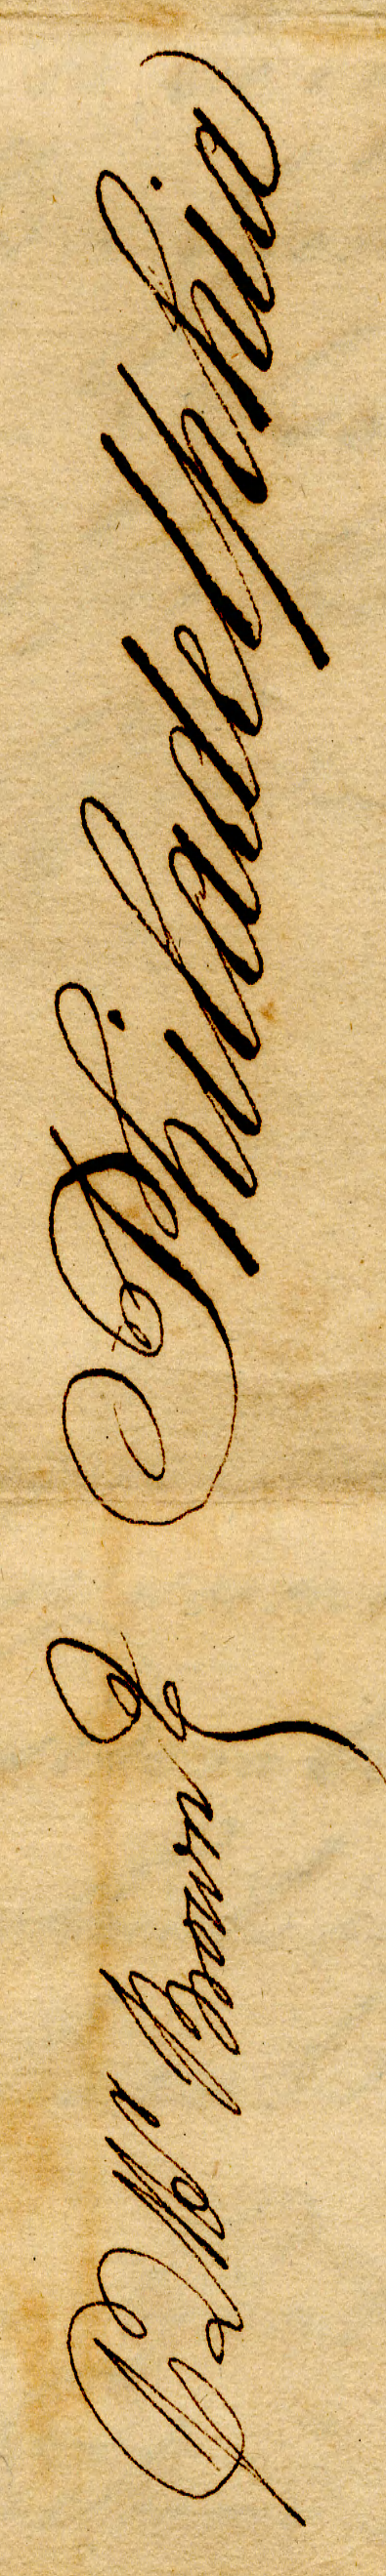per M^r Brown Philadelphia
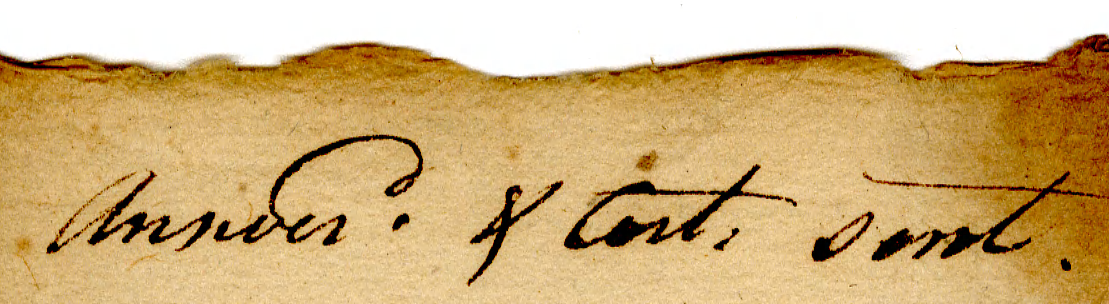Answer^d. & Cert. sent.
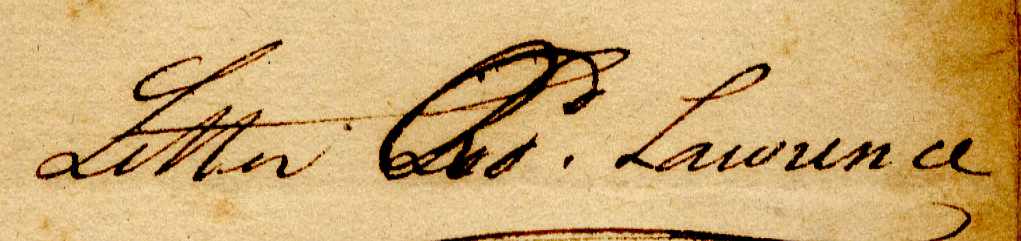Letter Ro^d. Lawrence
